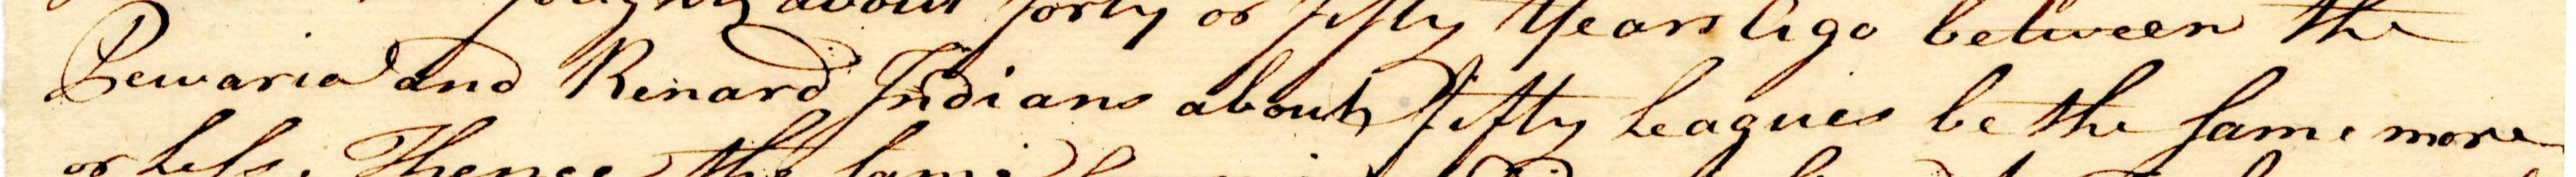Pewaria and Renard Indians about fifty leagues be the same more
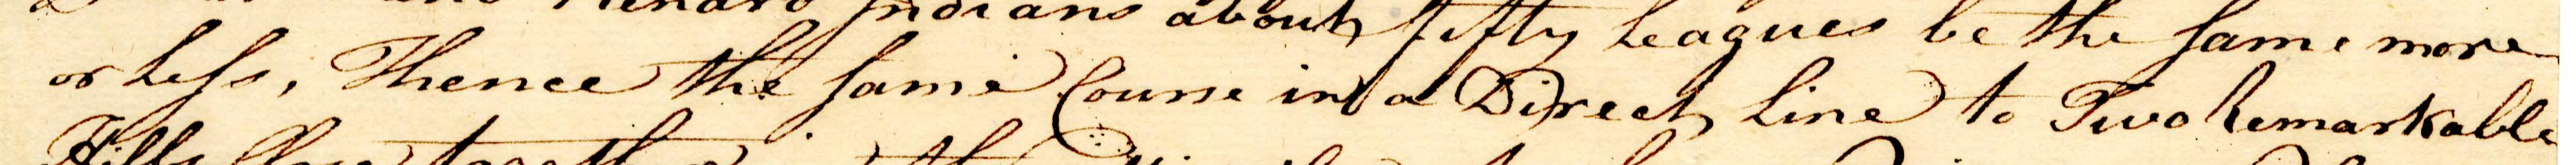or less, Thence the same course in a Direct line to Two Remarkable
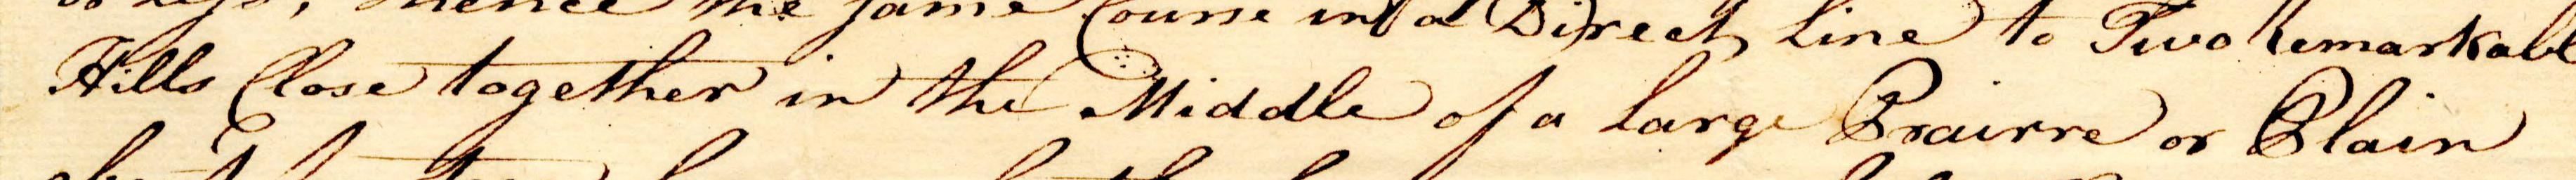Hills close together in the Middle of a Large Prairie or Plain
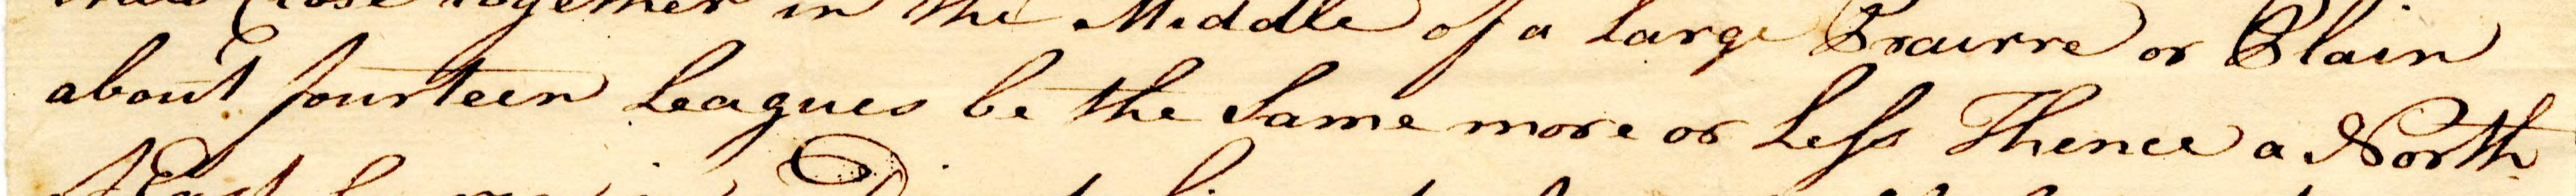about fourteen Leagues be the same more or less Thence a Forth
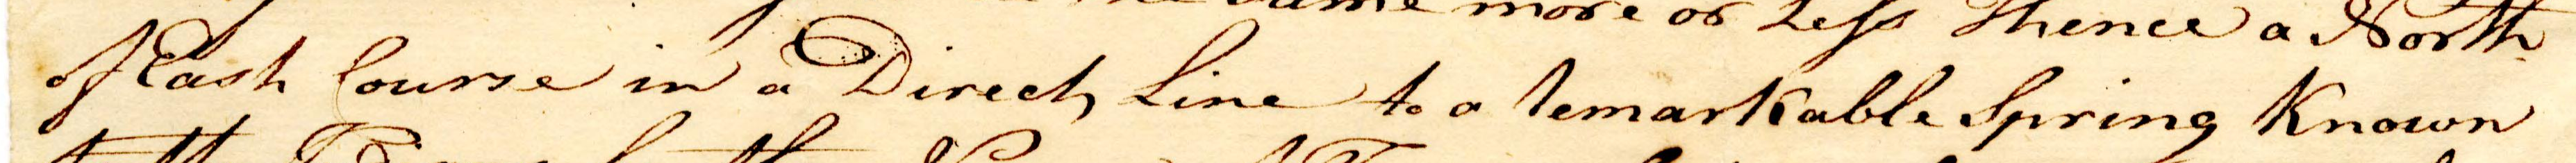of East Course in a Direct Line to a remarkable Spring Known
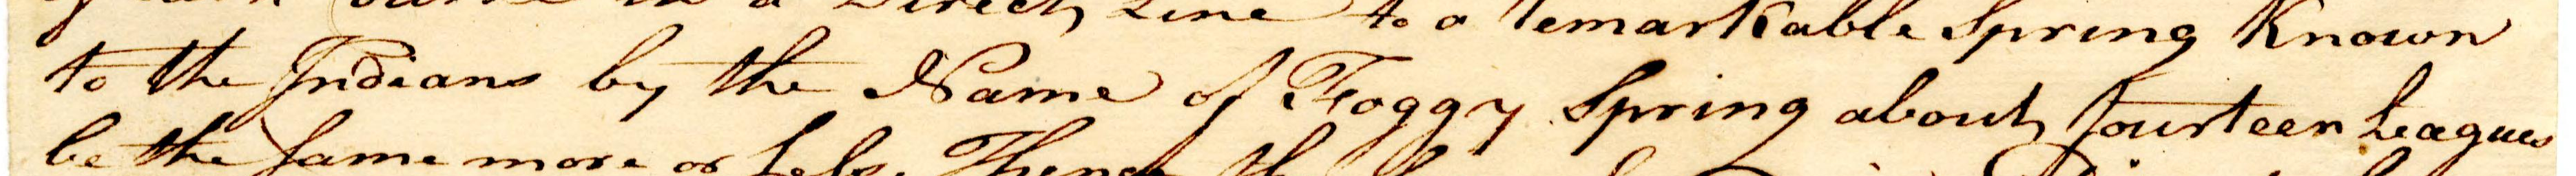to the Indians by the Name of Foggy Spring about fourteen leagues
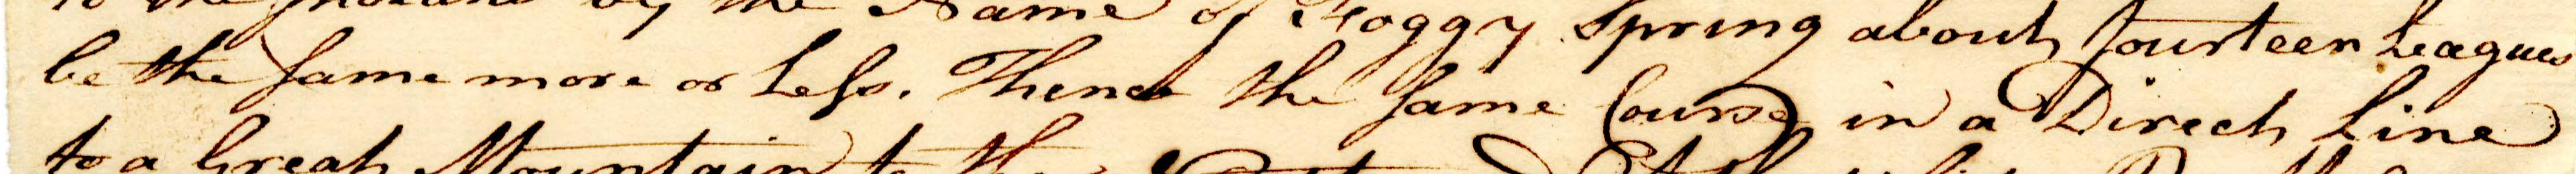be the same more or Less. Thence the same Course in a Directs Line
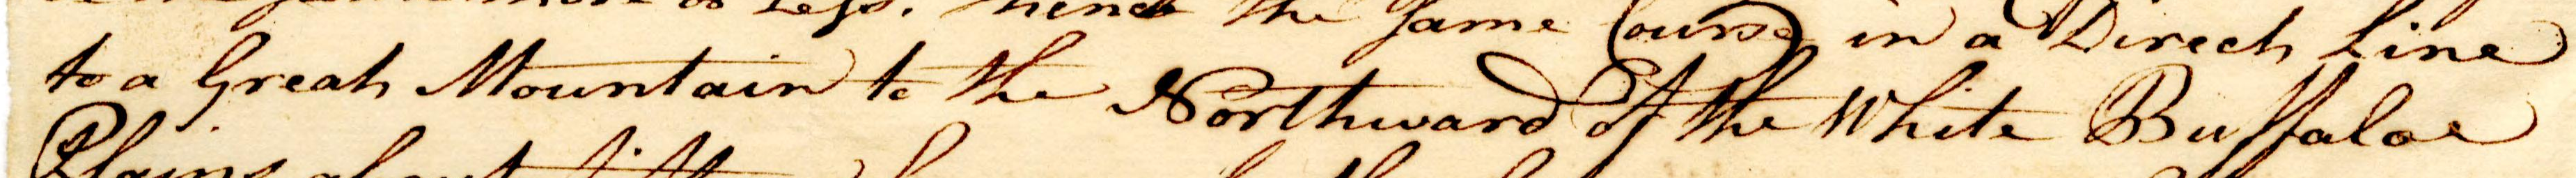to a Great Mountain to the Northward of the white Buffaloe
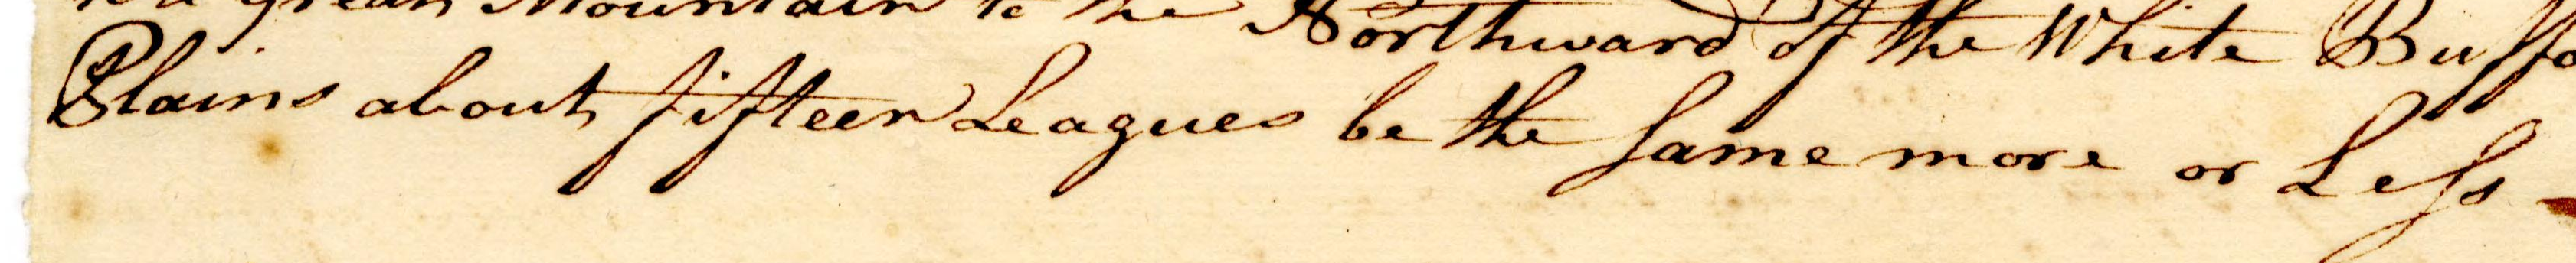Plains about fifteen Leagues be the same more or Less
